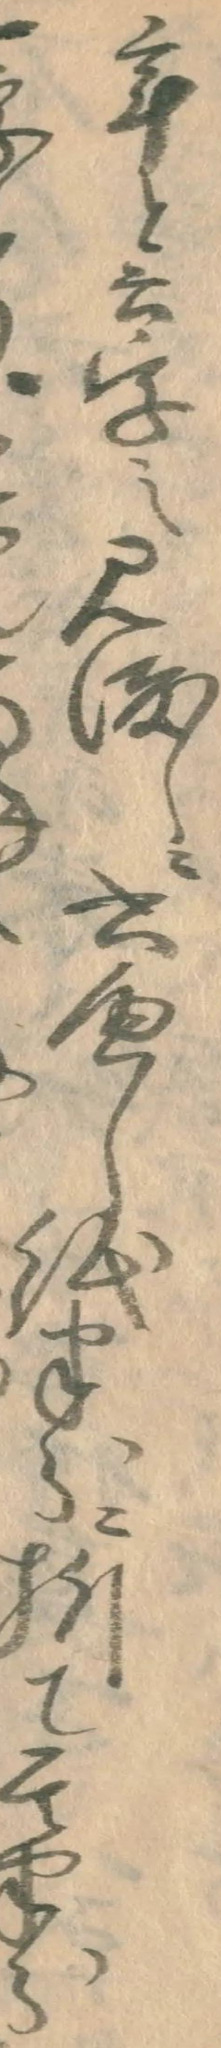年と云字之見渡しニ書へし紙半分ニ折て其半分ゟ
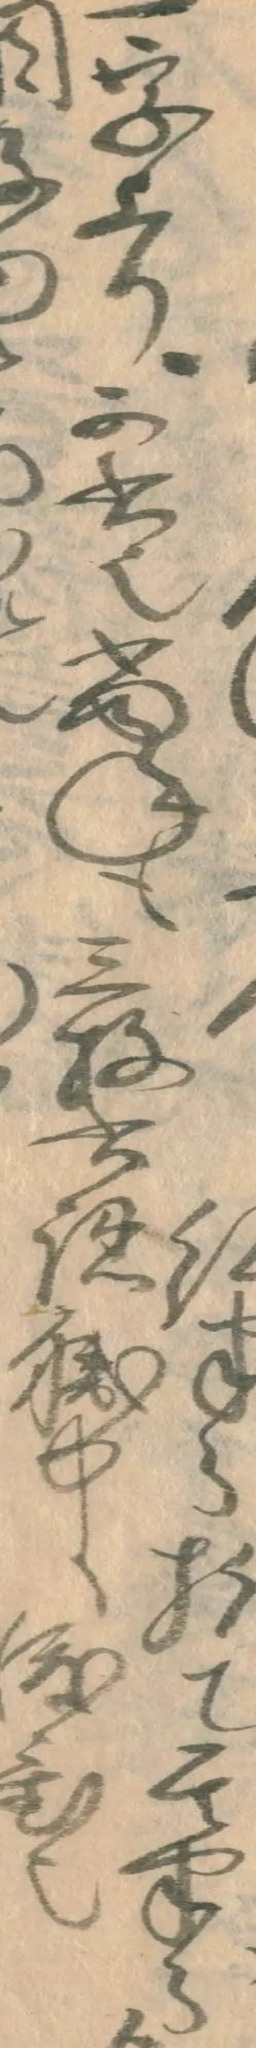一字上り可書也当年も三枚書認職中へ渡置也
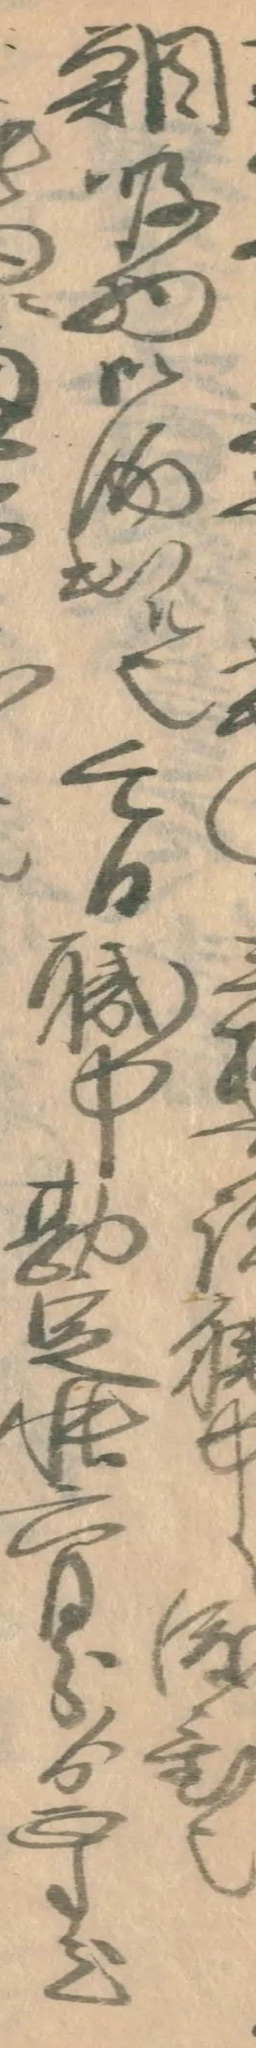鯛吸物御酒出ル也今日職中勘定帳六月分ゟ正月迄
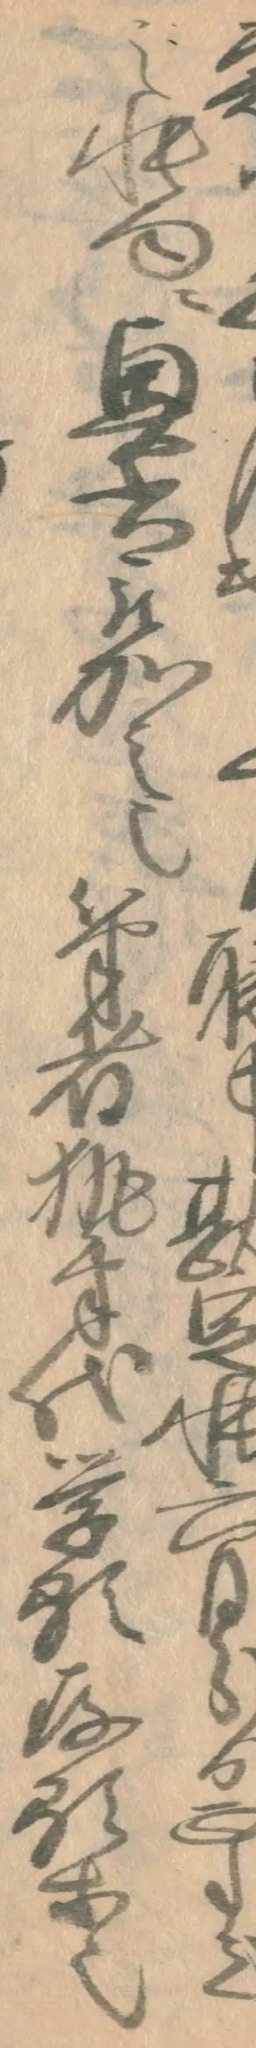之帳面ニ奥書被加之也筆者執筆代学顕存顕等也
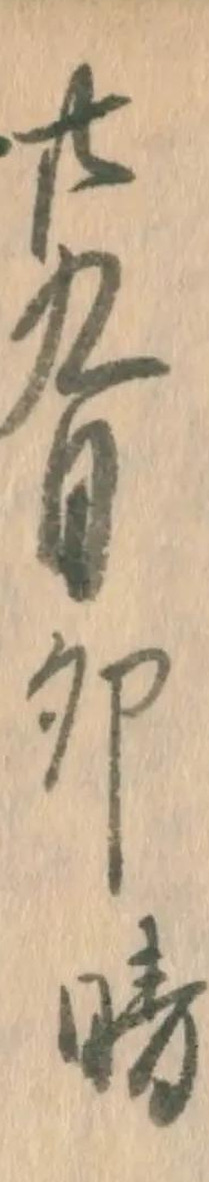廿九日卯晴
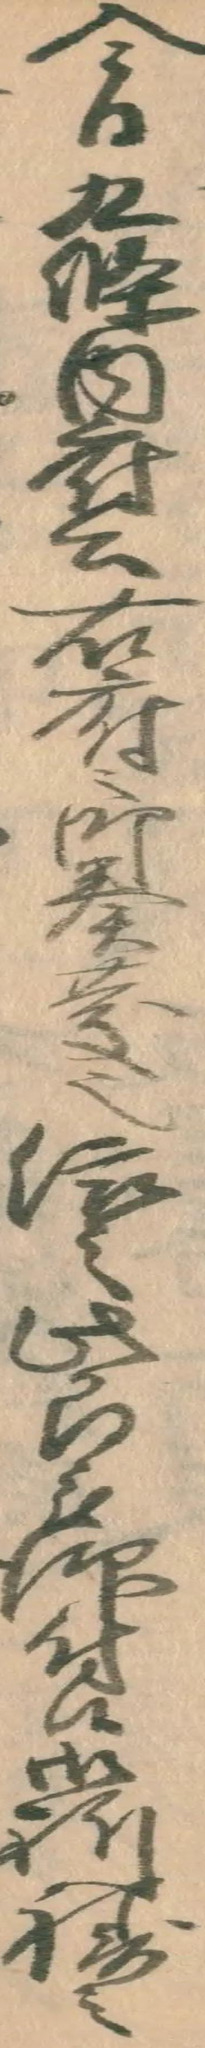今日九条内府公右府之御奏慶也依之此間被仰付候御祈祷之
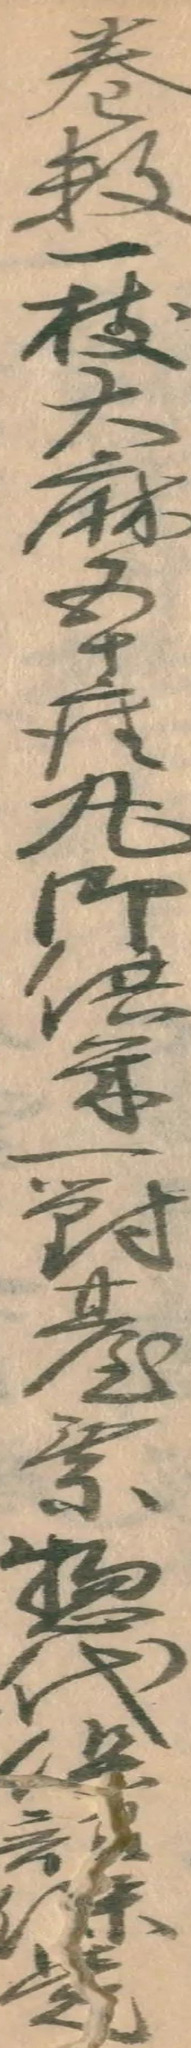巻数一枝大麻五十座丸御供米一対台乗惣代保韶保覚
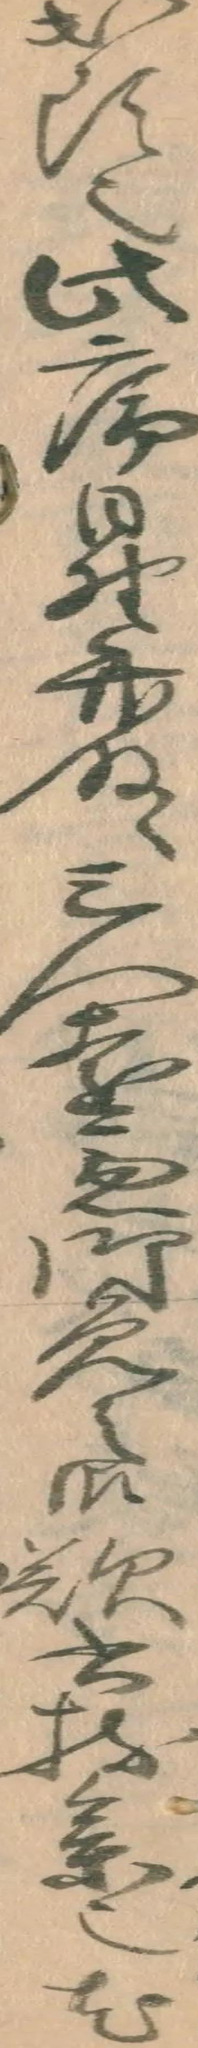出頭也此序日野弁殿へ三人遠慮御免之御歎書持参也尤
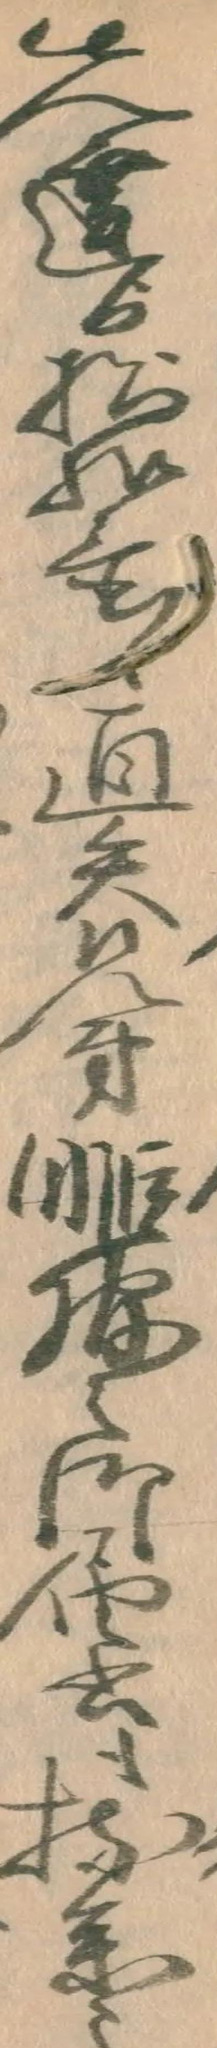先達ゟ指扣置候直矢兄弟暇服之御届書も持参也
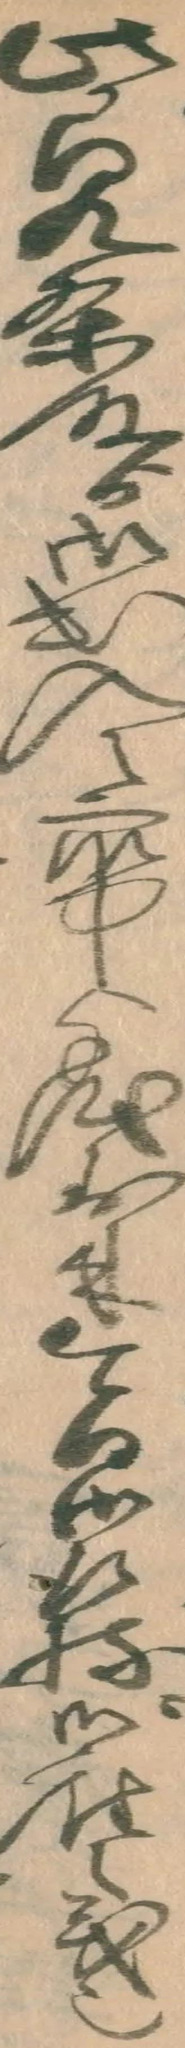此間九条殿ゟ御出入之衆中へ手紙到来今日御取持ニ御雇之義也
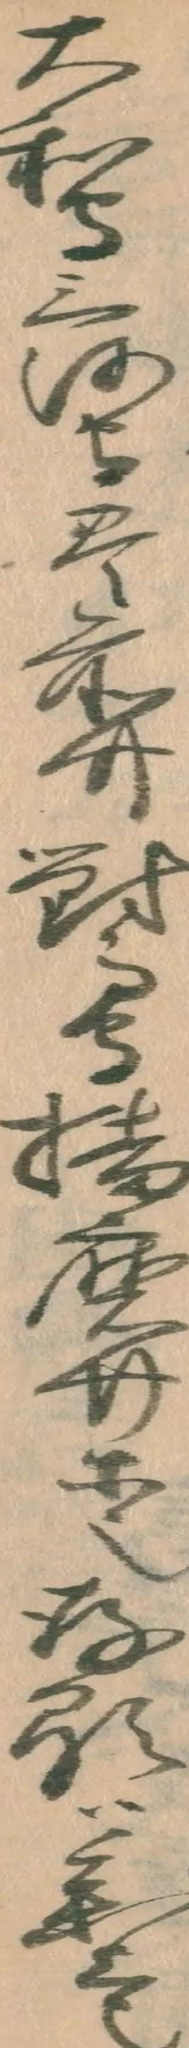大和守三河守豊前介対馬守播磨介等也存顕ハ参上也
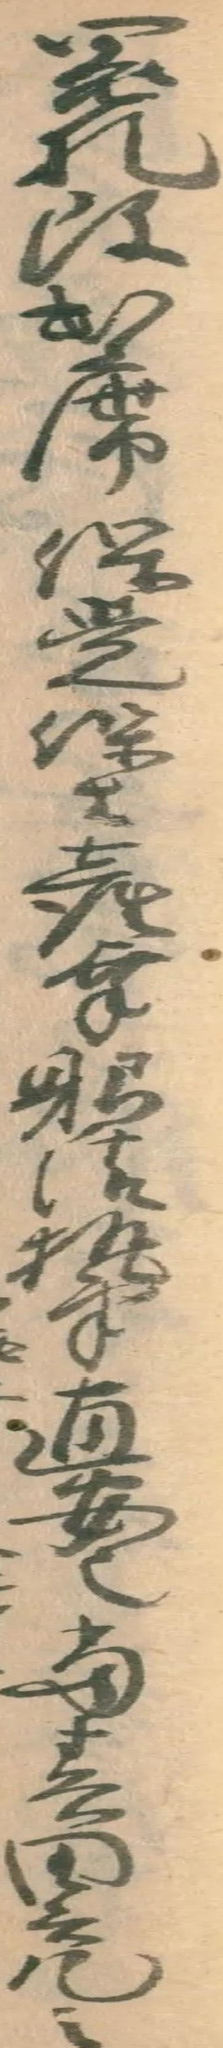鬮札改出席保覚保土産幸躬清執筆直安也当春田充之
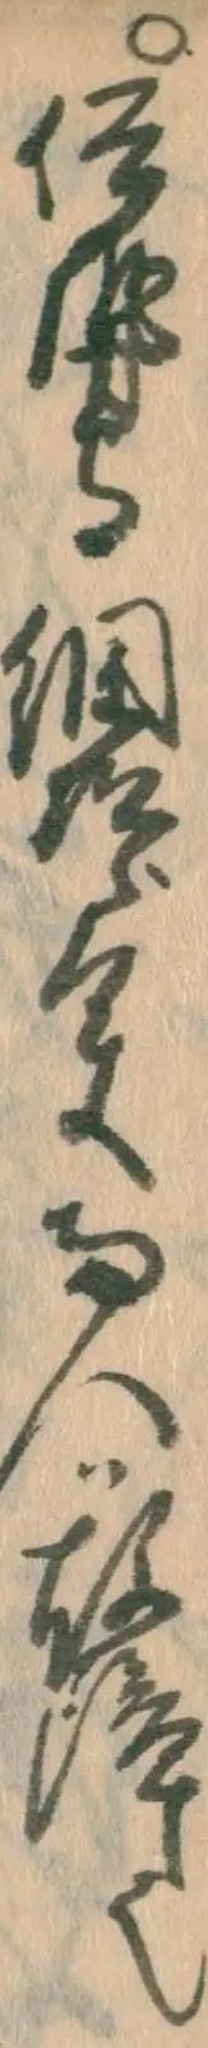◦守綱次郎大夫両人ハ故障也
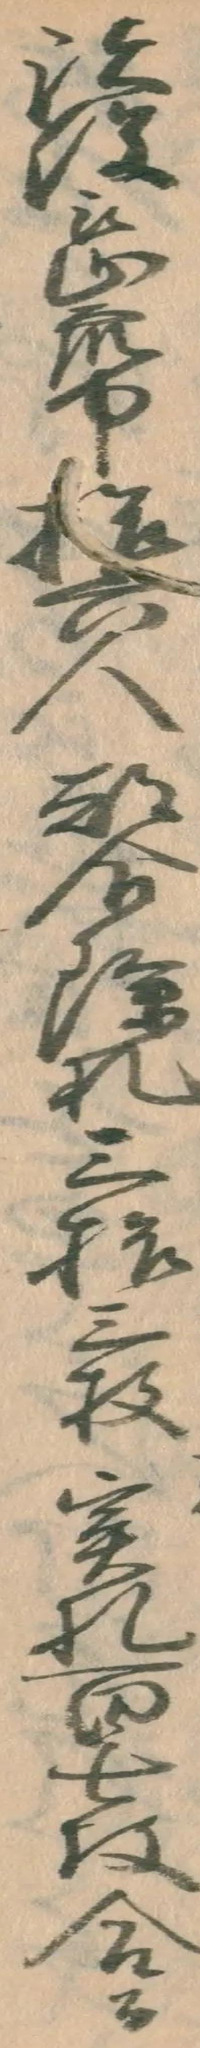詰役被止衆中拾六人都合除札三拾三枚実札百七枚合而
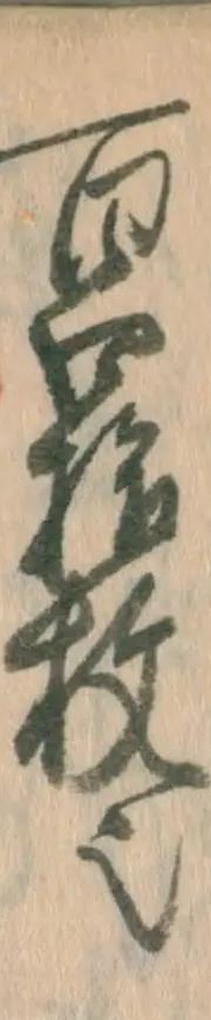百四拾枚也
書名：賀茂社記録. 第60冊
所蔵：国立国会図書館 National Diet Library, JAPAN
